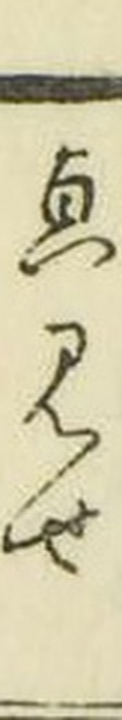魚見せ
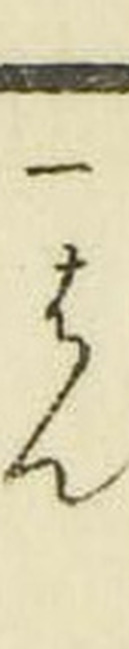一はん
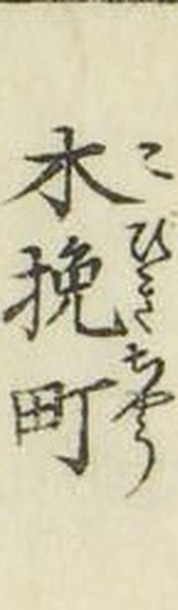木挽町

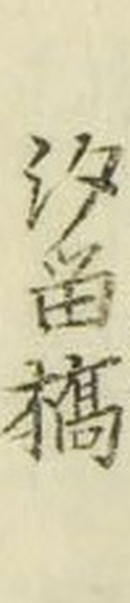汐留橋

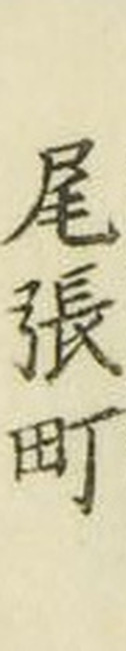尾張町
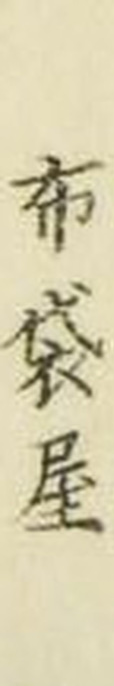布袋屋
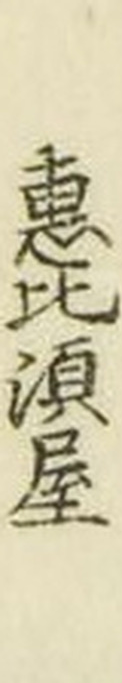恵比須屋
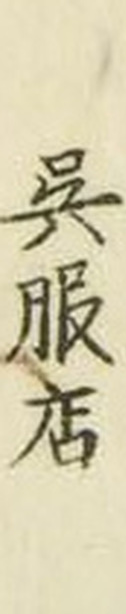呉服店

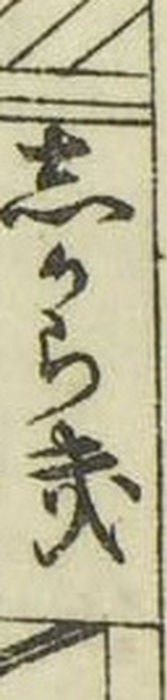しからき
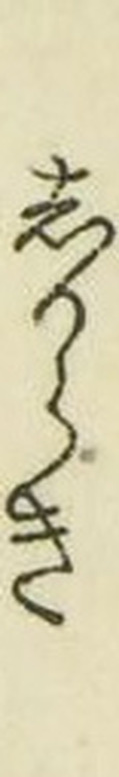しからき
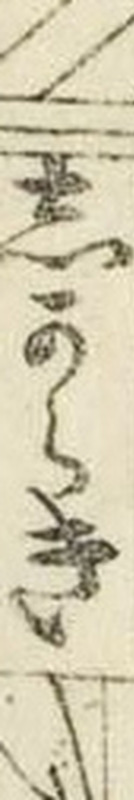しからき
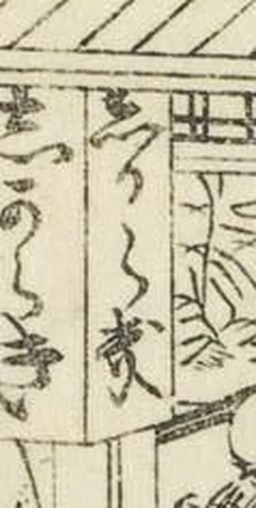しからき
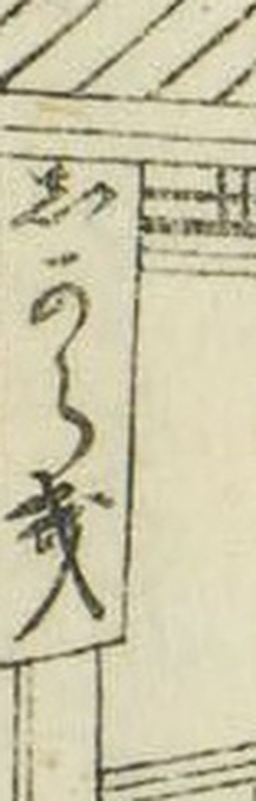しからき
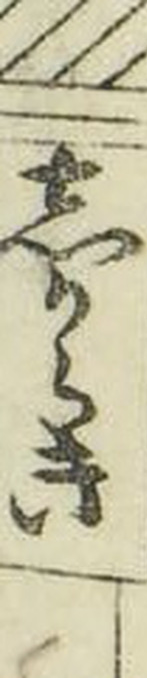しからき

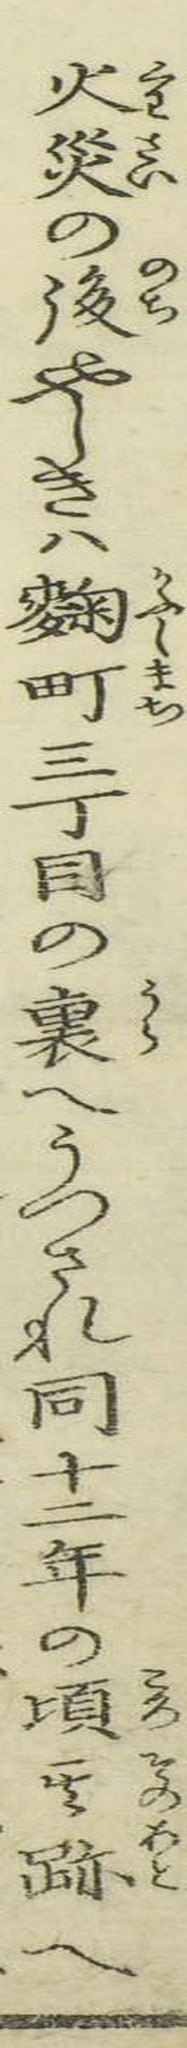火災の後やしきは麴町三丁目の裏へうつされ同十二年の頃其跡へ
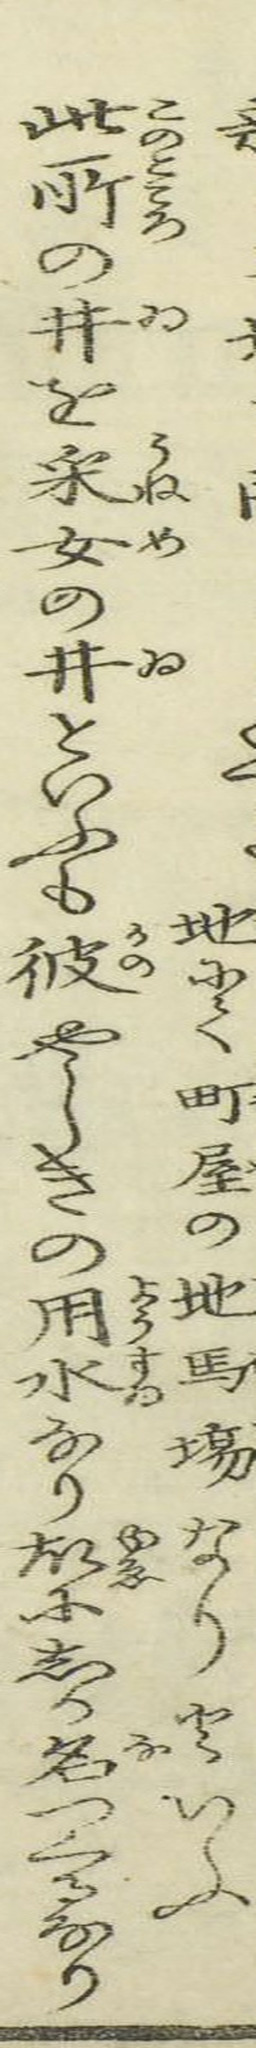此所の井を采女の井といふも彼やしきの用水なり故にしか名つくるなり
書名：江戸名所図会 20巻 巻之2
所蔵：東京学芸大学教育コンテンツアーカイブ
